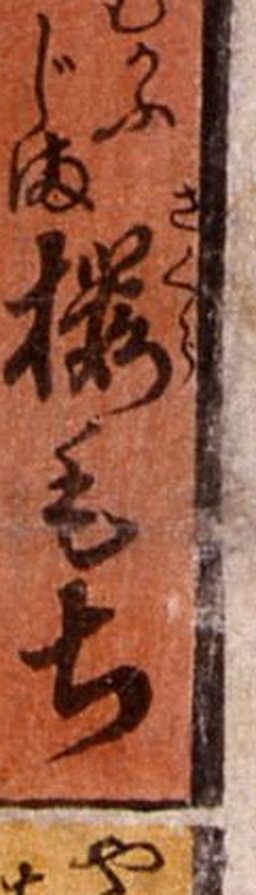六つ桜もち
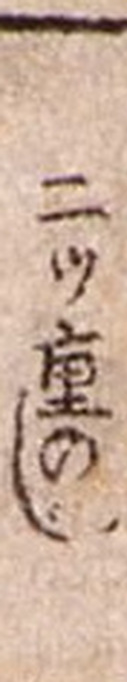二つ重のし
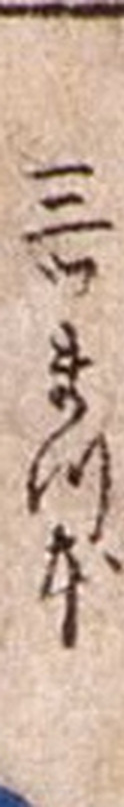三つまつ本
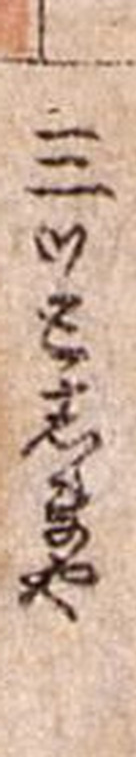二つとしまや
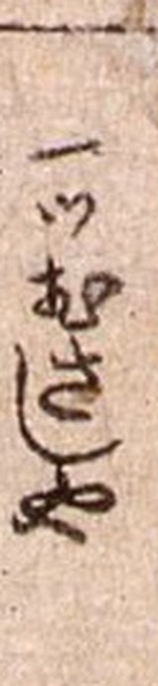一つむさしや
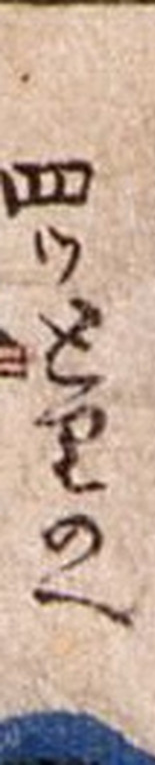四つとりかへ
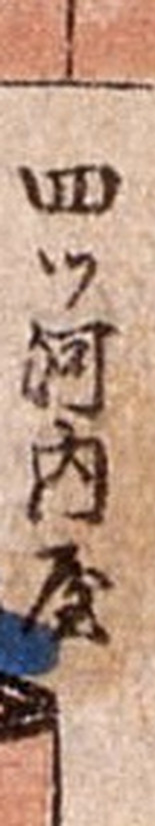四つ河内屋
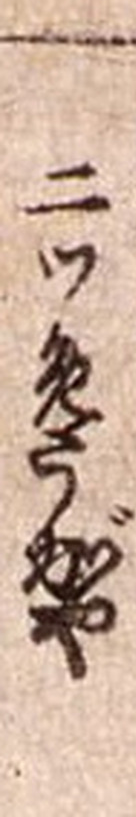二つめうがや
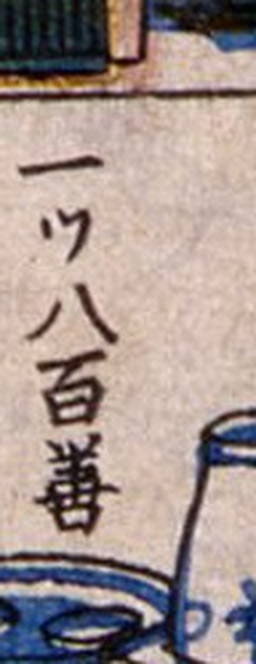一つ八百善
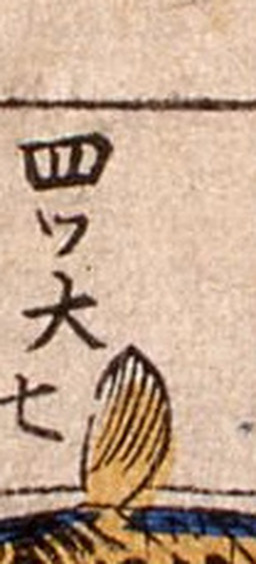四つ大七
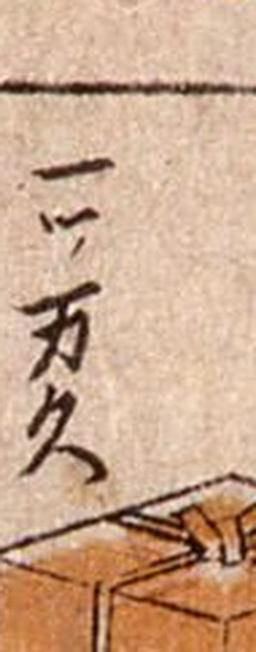一つ万久
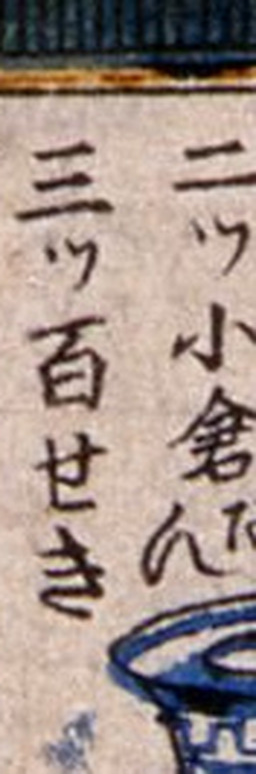三つ百せき
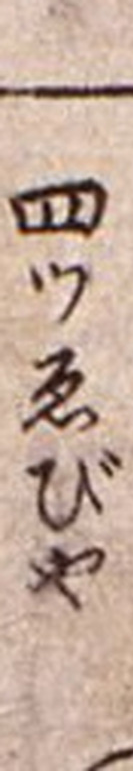四つゑびや
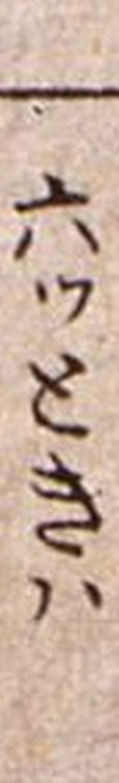六つときは
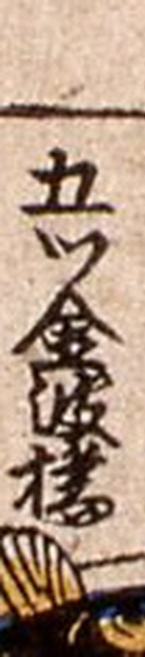五つ金波楼
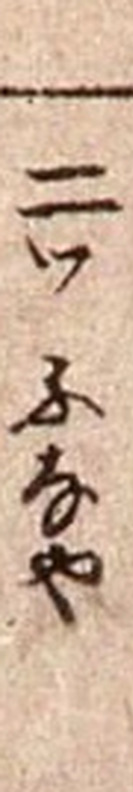二つふなや
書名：新版御府内流行名物案内雙六
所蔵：東京学芸大学附属図書館
